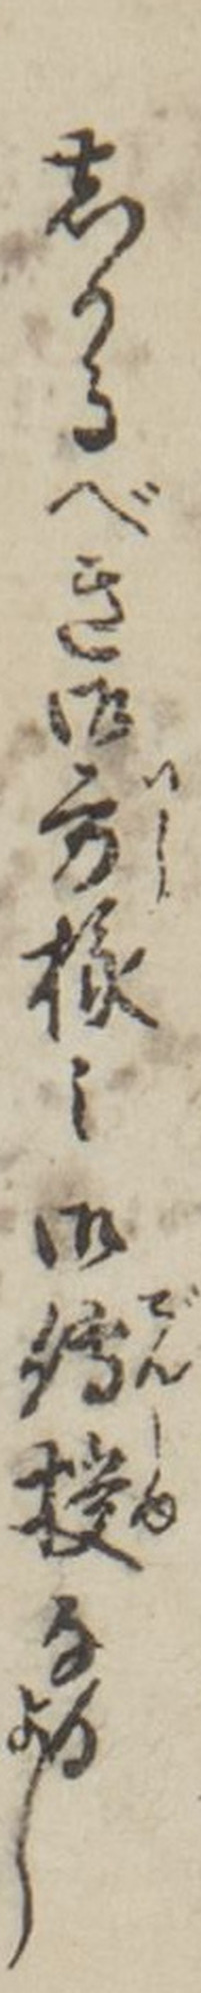しかるべき御方様之御伝授なるよし
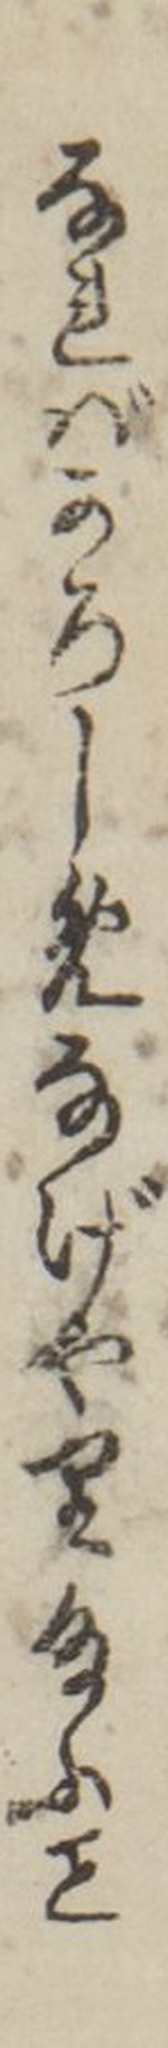なればかろしめなげやり給ふこと
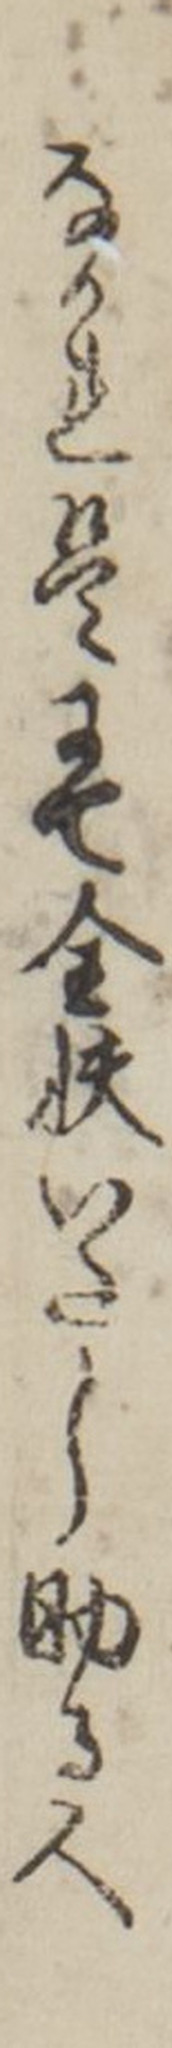なかれ是にて全快いたし助る人
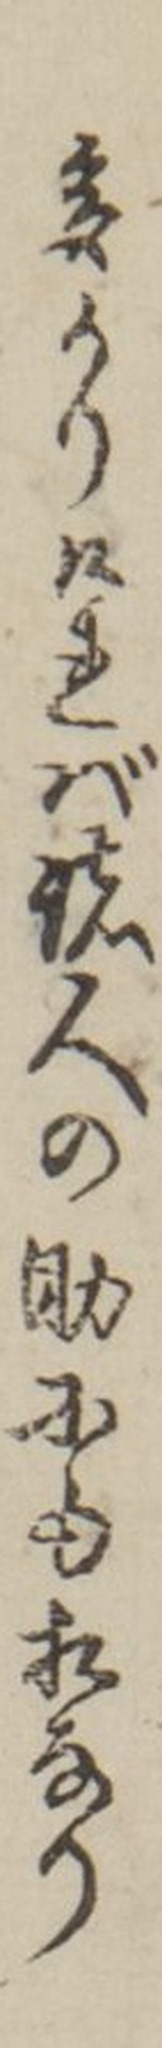多かりければ諸人の助にも相なり
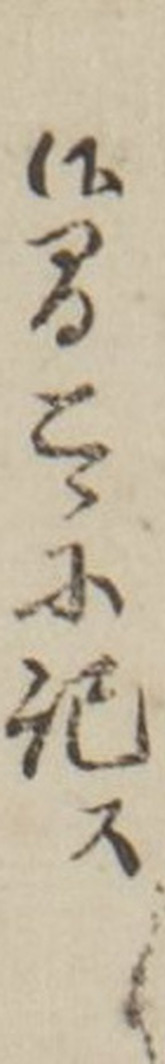候間こゝに記す
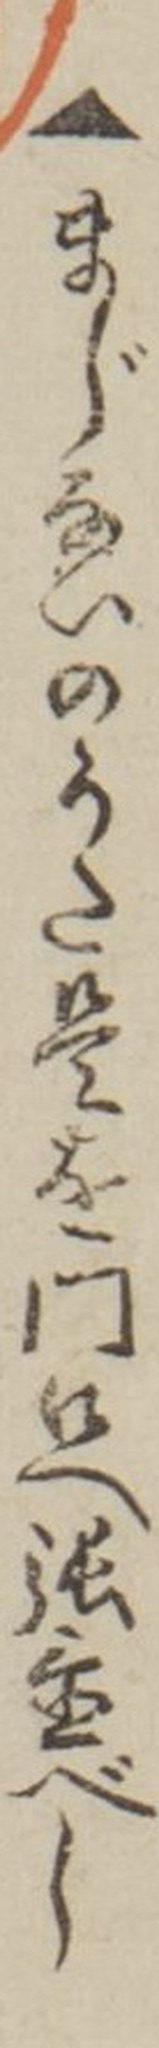▲まじないのうた是を門口へ張置べし
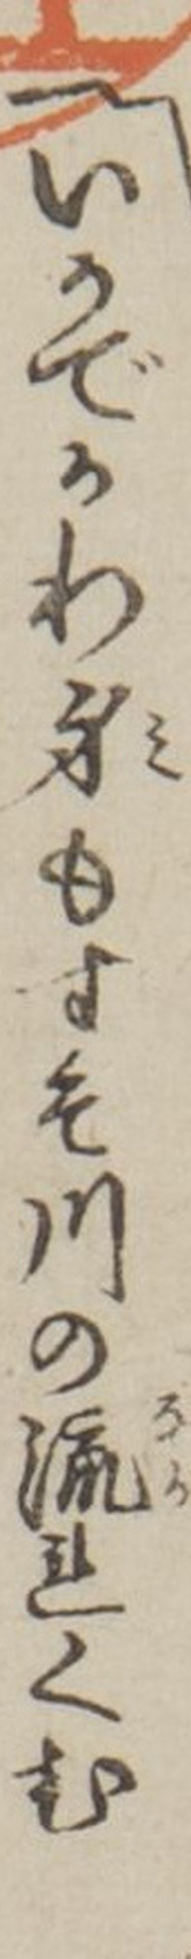〽いかでかわ身もすそ川の流れくむ
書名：当時流行病療養妙伝
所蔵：あいおいニッセイ同和損保株式会社
